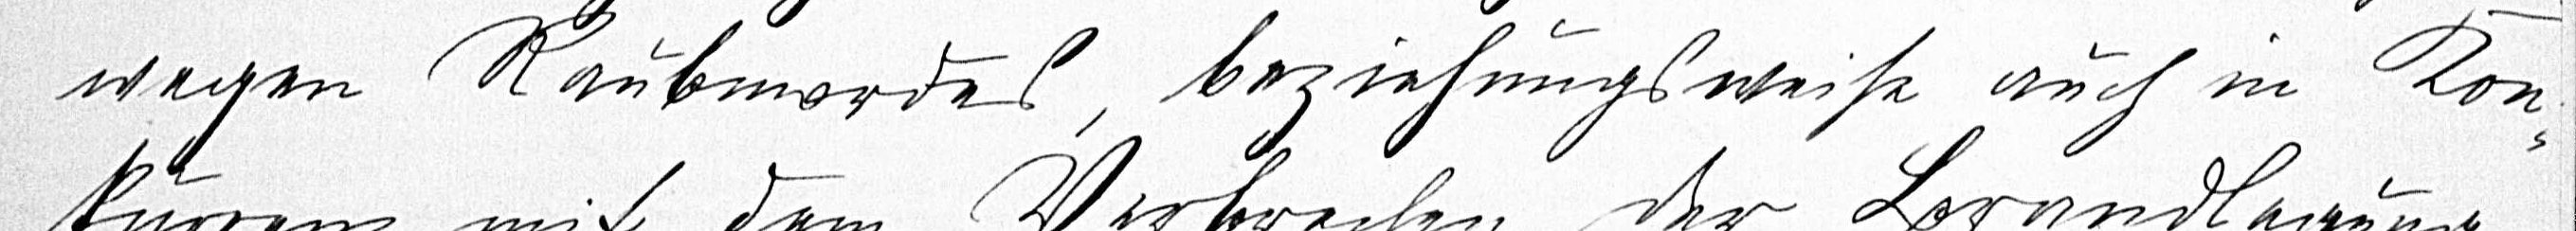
wegen Raubmordes, beziehungsweise auch in Kon¬
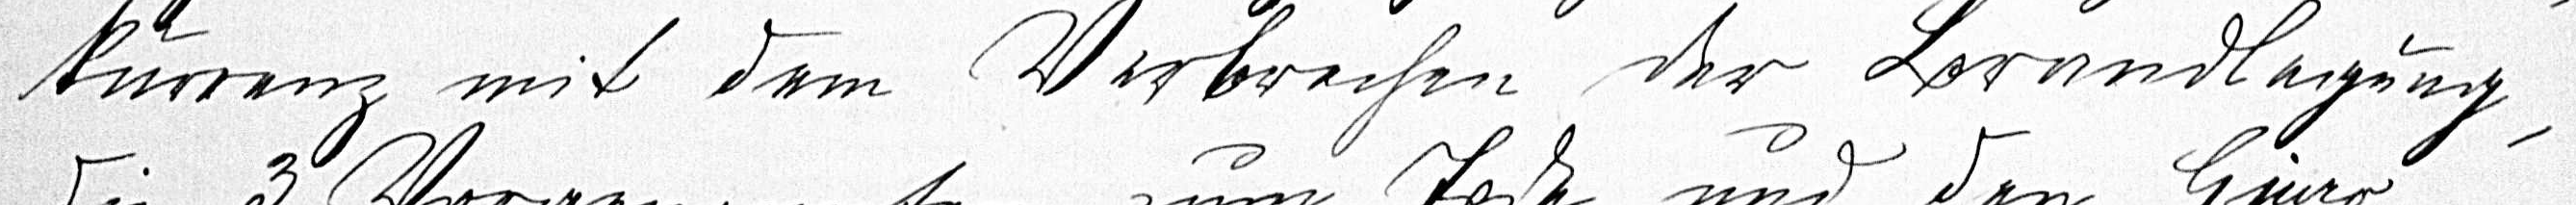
kurrenz mit dem Verbrechen der Brandlegung,
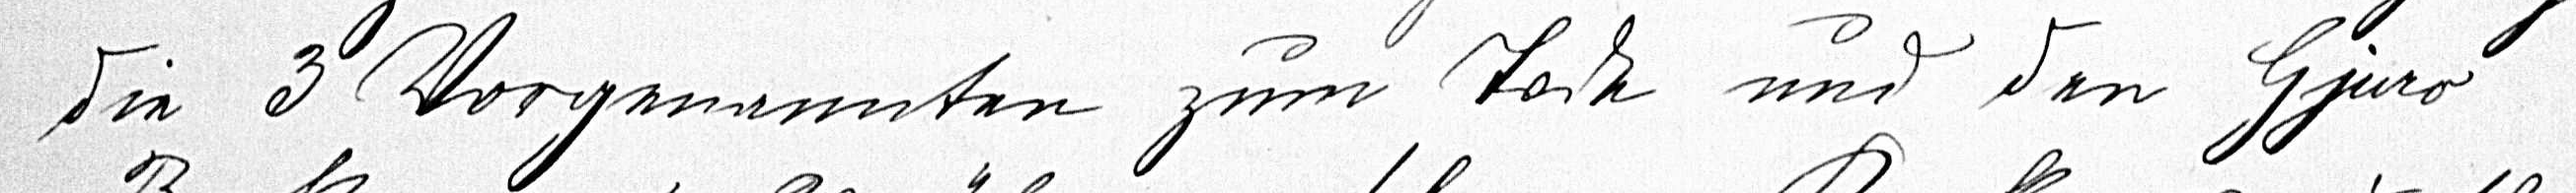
die 3 Vorgenannten zum Tode und den Gjuro
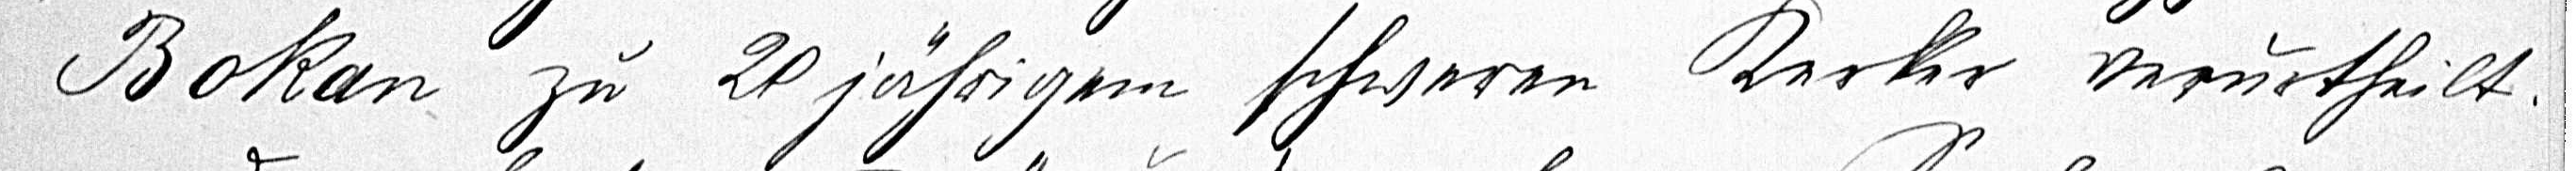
Bokan zu 20 jährigen schweren Kerker verurtheilt.
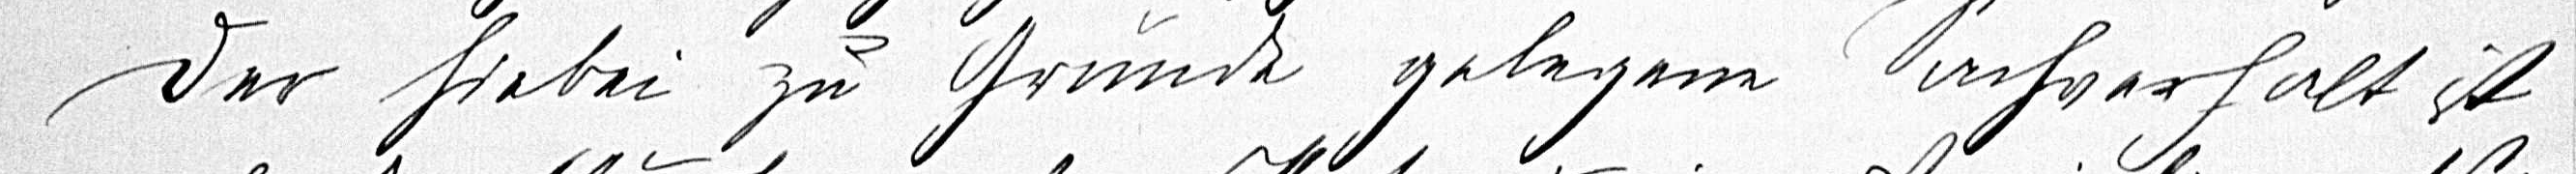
Der hiebei zu Grunde gelegene Sachverhalt ist
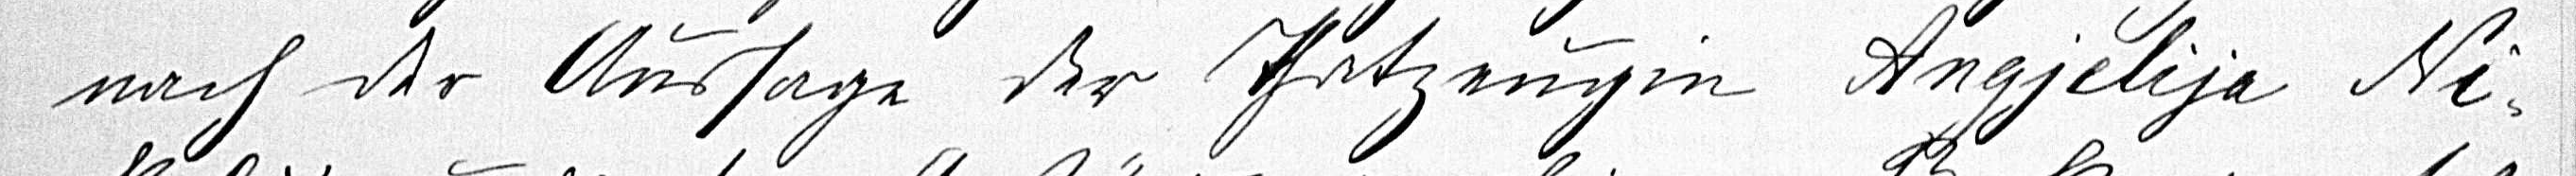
nach der Aussage der Thatzeugin Angjelija Ni¬
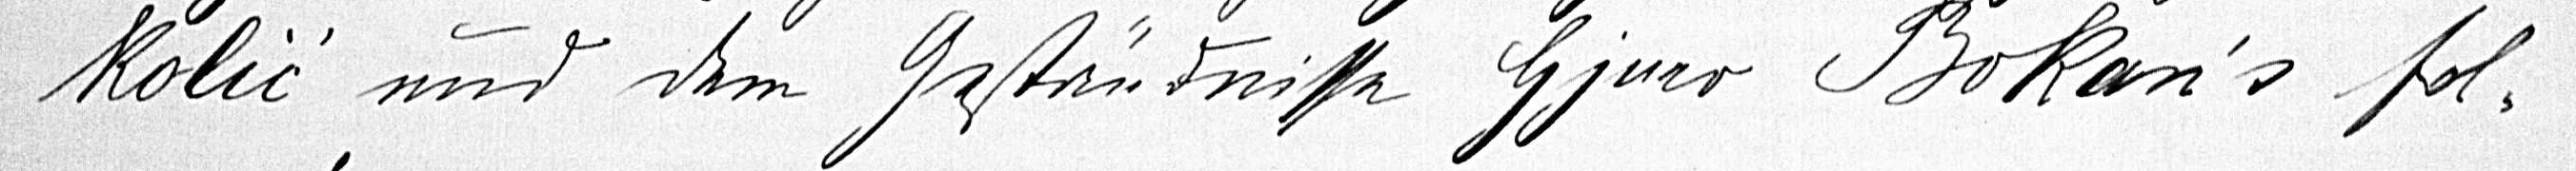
kolić und dem Geständnisse Gjuro Bokan's fol¬
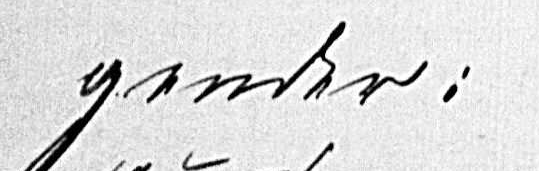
gender:
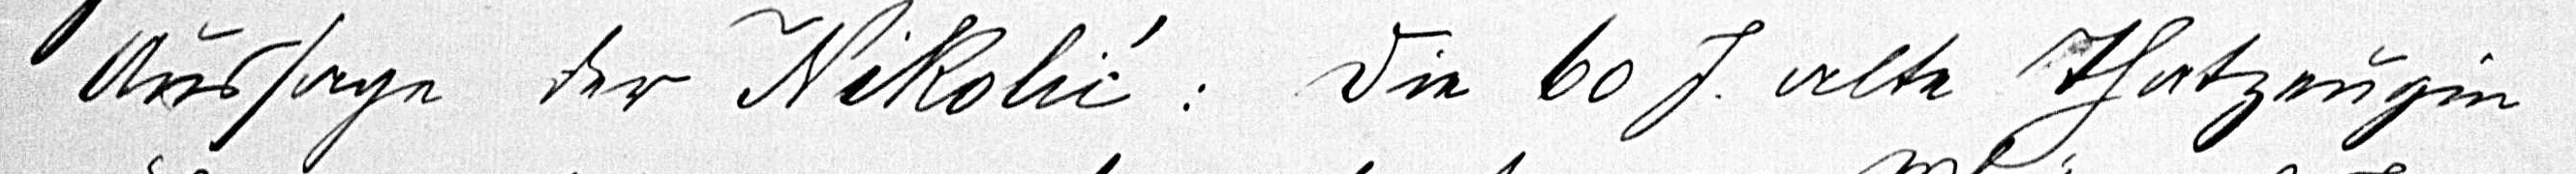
Aussage der Nikolić: die 60 J. alte Thatzeugin
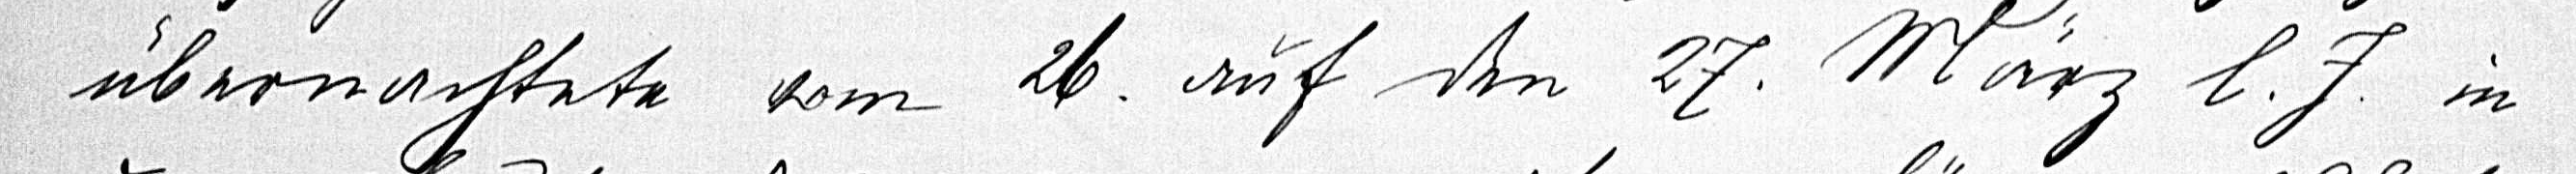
übernachtete vom 26. auf den 27. März l. J. in
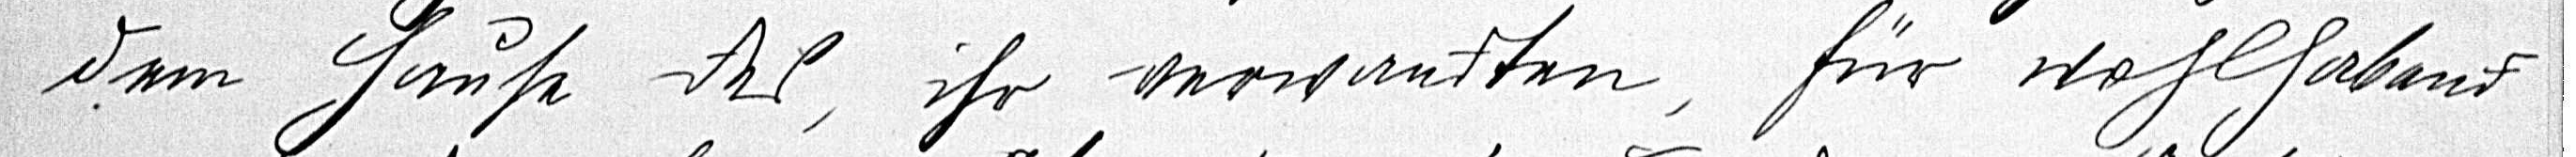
dem Hause des, ihr verwandten, für wohlhabend
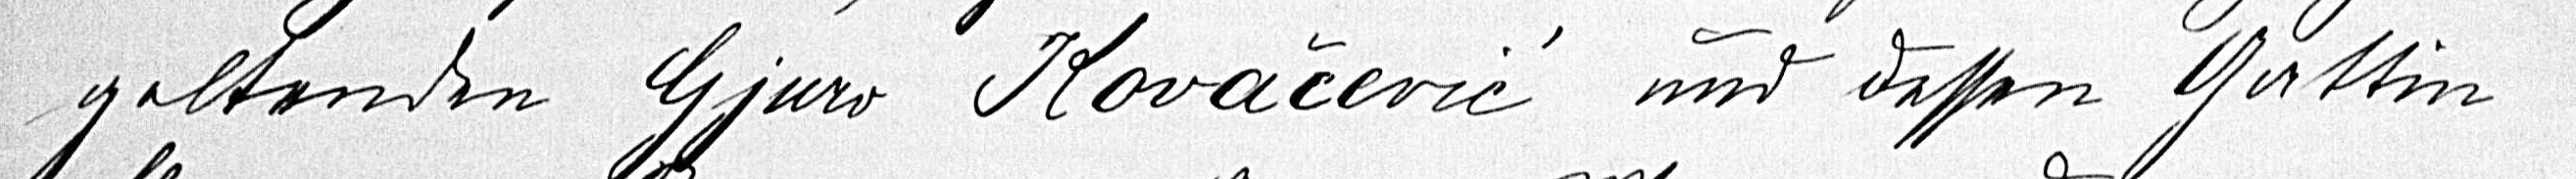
geltenden Gjuro Kovačević und dessen Gattin
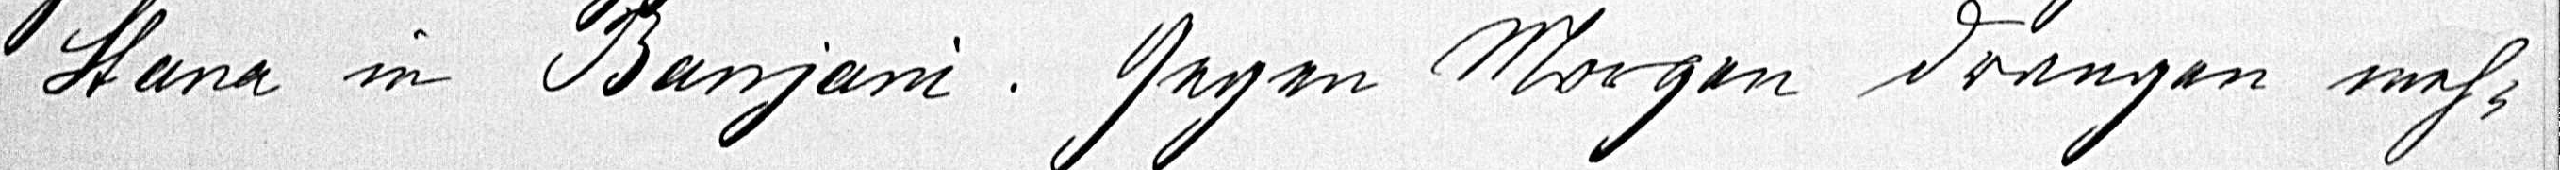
Stana in Benjani. Gegen Morgen drangen meh¬
